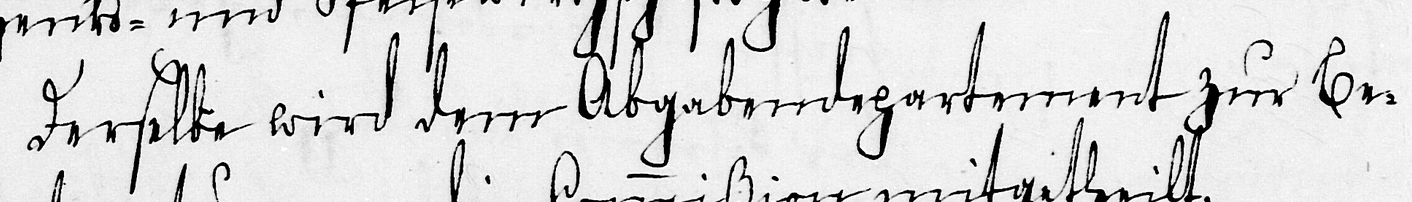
Derselbe wird dem Abgabendepartement zur Be¬
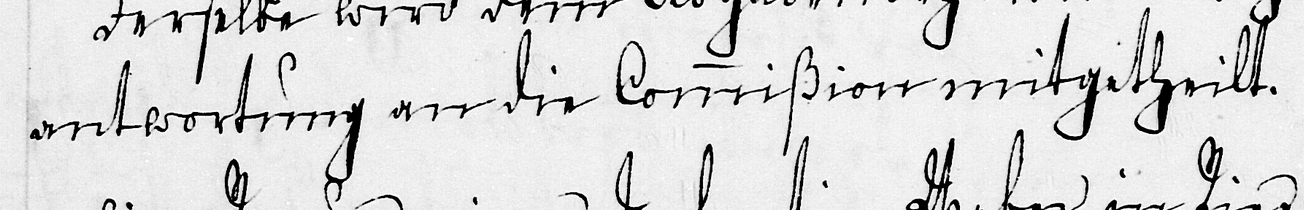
antwortung an die Commißion mitgetheilt.
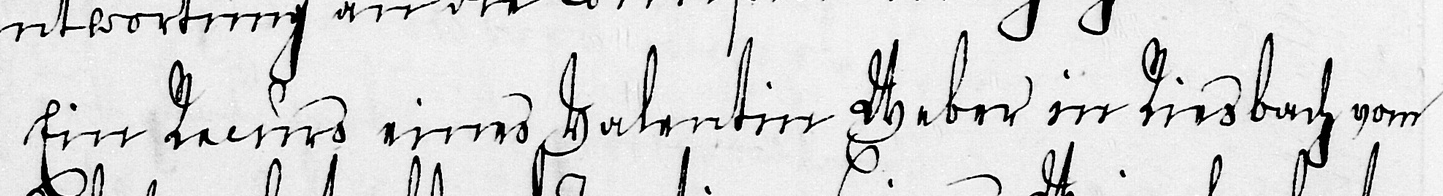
Ein Recurs eines Valentin Weber in Riesbach vom
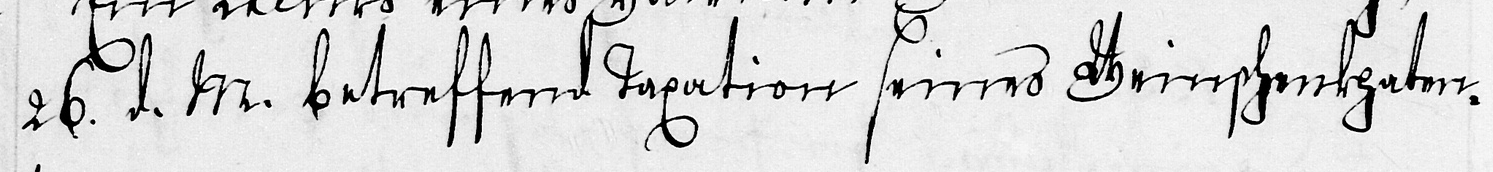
26. d. M. betreffend Taxation seines Weinschenkpaten¬
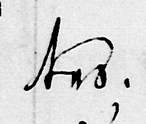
tes.
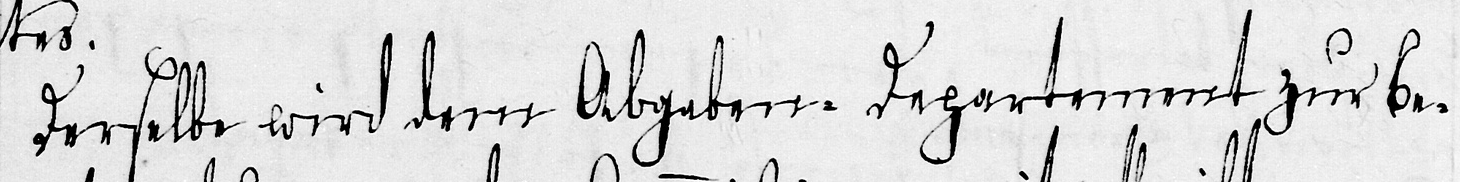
Derselbe wird dem Abgaben-Departement zur Be¬
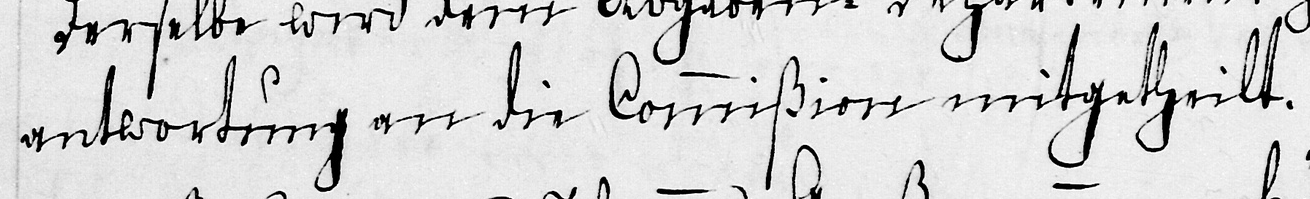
antwortung an die Commißion mitgetheilt.
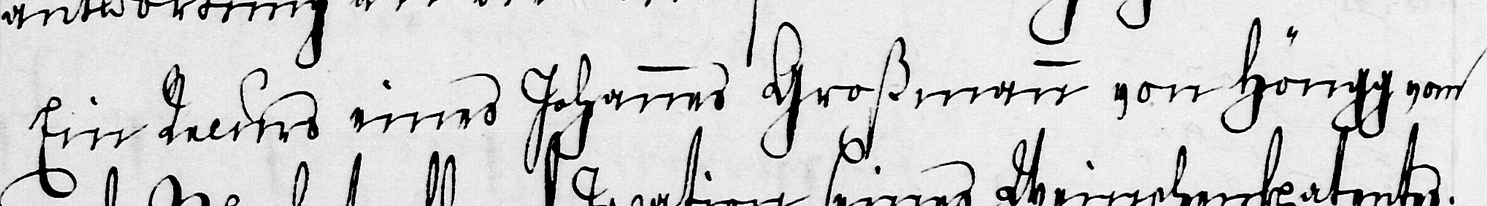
Ein Recurs eines Johannes Großmann von Höngg von
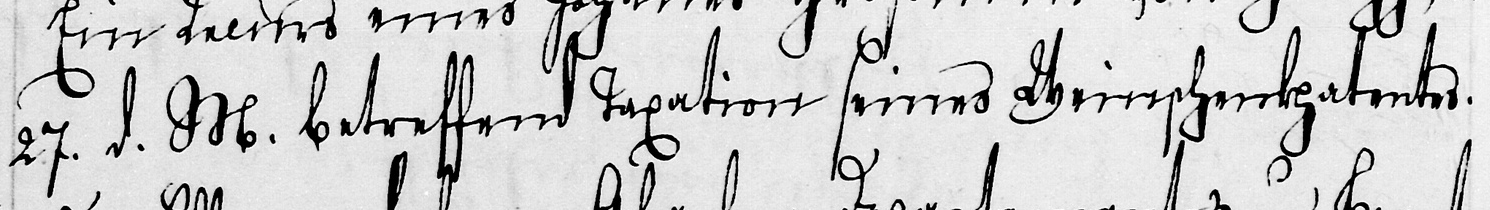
27. d. M. betreffend Taxation seines Weinschenkpatentes.
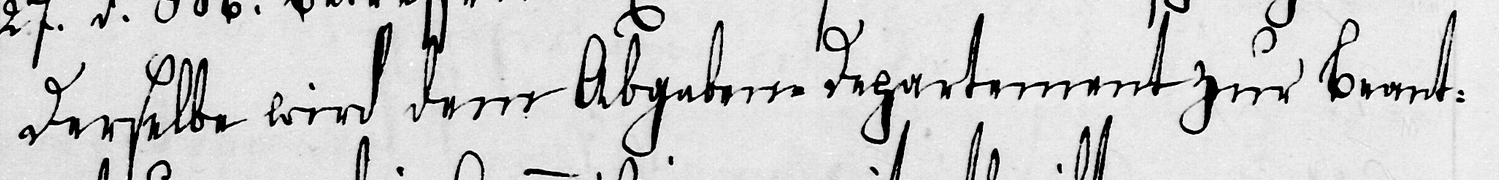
Derselbe wird dem Abgaben-Departement zur Beant¬
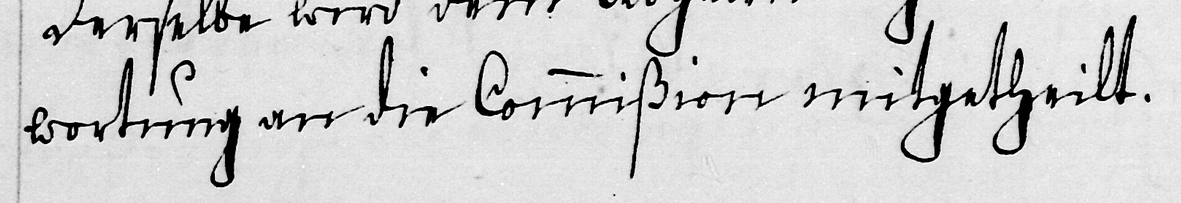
wortung an die Commißion mitgetheilt.
